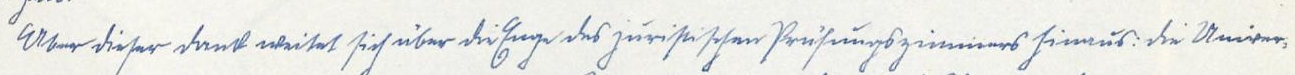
Aber dieser Dank weitet sich über die Enge des juristischen Prüfungszimmers hinaus: Die Univer-
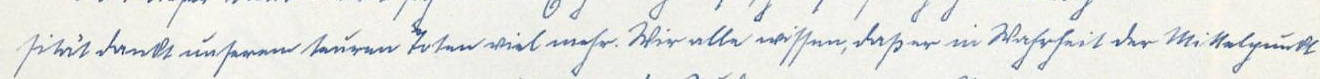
sität dankt unserem teuren Toten viel mehr. Wir alle wissen, daß er in Wahrheit der Mittelpunkt
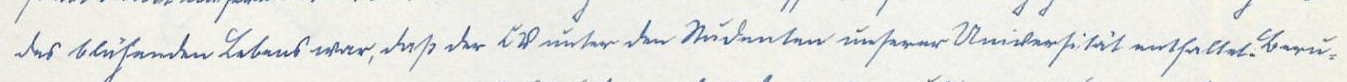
des blühenden Lebens war, daß der CV unter den Studenten unserer Universität entfaltet. Beru-
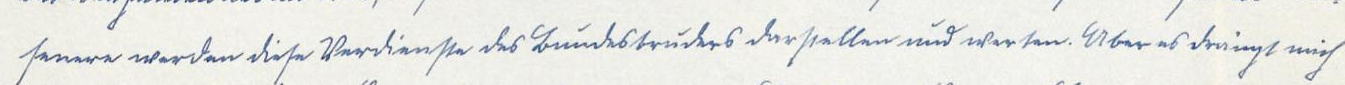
fenere werden diese Verdienste des Bundesbruders darstellen und werten. Aber es drängt mich
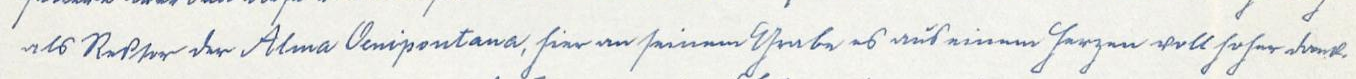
als Rektor der Alma Oenipontana, hier an seinem Grabe es aus einem Herzen voll hoher Dank-
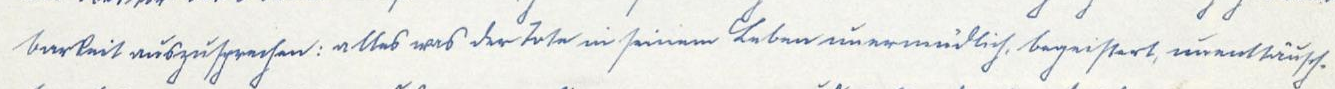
barkeit auszusprechen: alles was der Tote in seinem Leben unermüdlich, begeistert, unenttäusch-
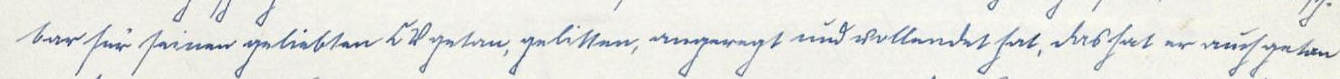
bar für seinen geliebten CV getan, gelitten, angeregt und vollendet hat, das hat er getan
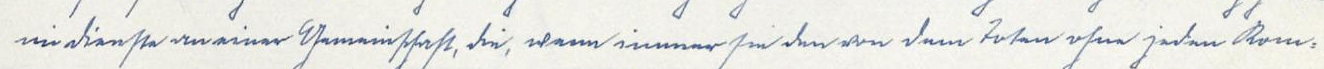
im Dienste an einer Gemeinschaft, die, wenn immer sie den von dem Toten ohne jeden Kom-
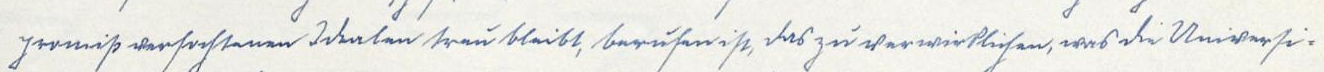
promiss verfochtenen Idealen treu bleibt, berufen ist, das zu verwirklichen was die Universi-
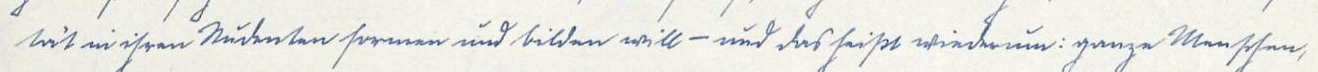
tät in ihren Studenten formen und bilden spielen will - und das heißt wiederum: ganze Menschen,
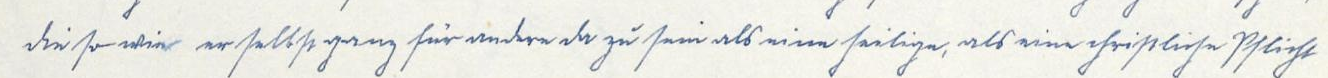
die so wie er selbst ganz für andere da zu sein als eine heilige, als eine christliche Pflicht
